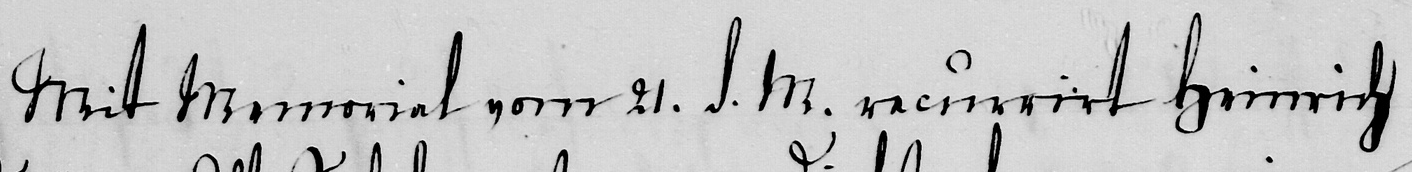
Mit Memorial vom 21. d. M. recurrirt Heinrich
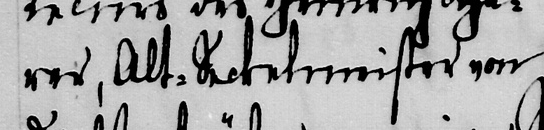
rer, Alt-Seckelmeister von
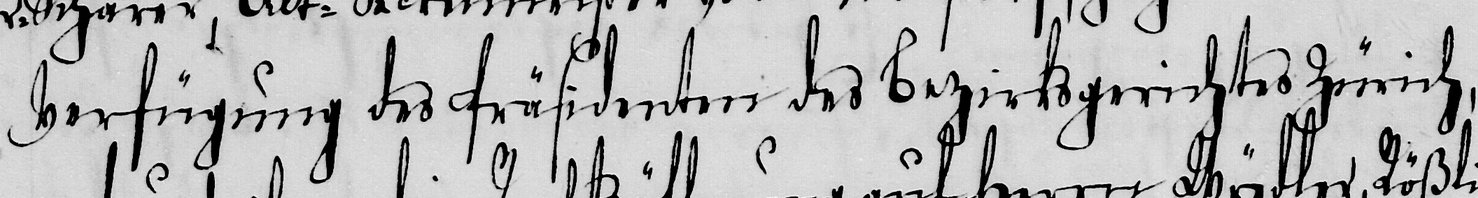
Verfügung des Präsidenten des Bezirksgerichtes Zürich,
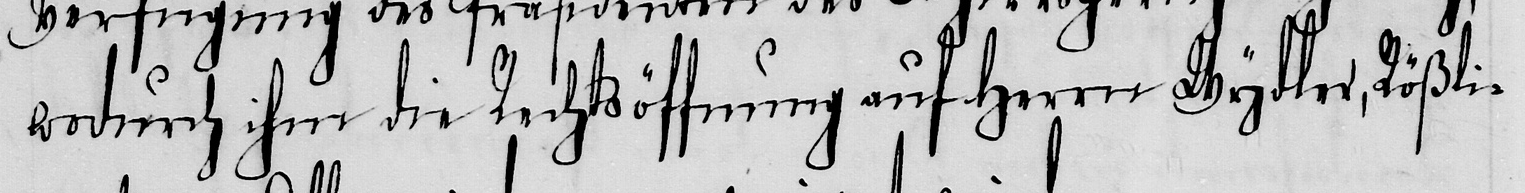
wodurch ihm die Rechtsöffnung auf Herrn Wydler, Rößli¬
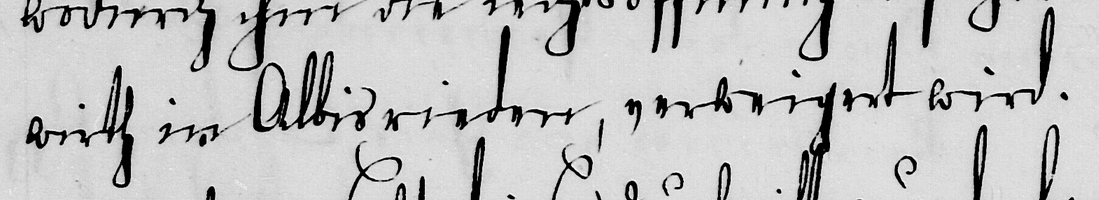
wirth in Albisrieden, verweigert wird.
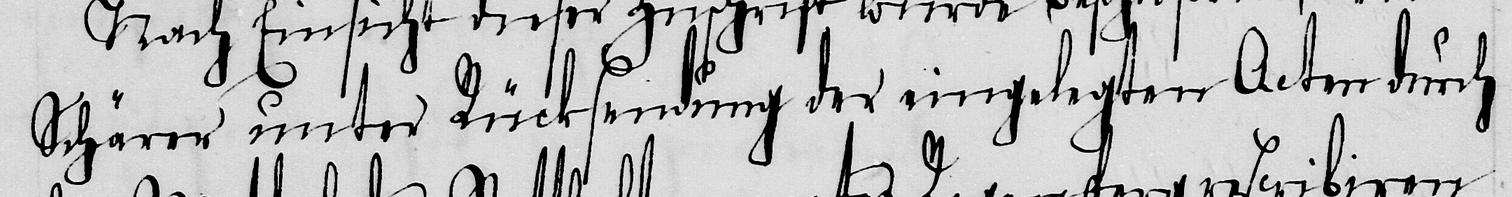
Schärer unter Rücksendung der eingelegten Acten durch
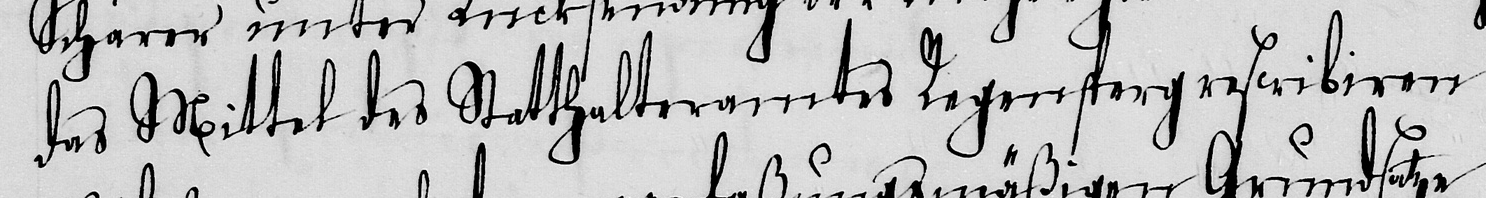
das Mittel des Statthalteramtes Regensperg rescribiren
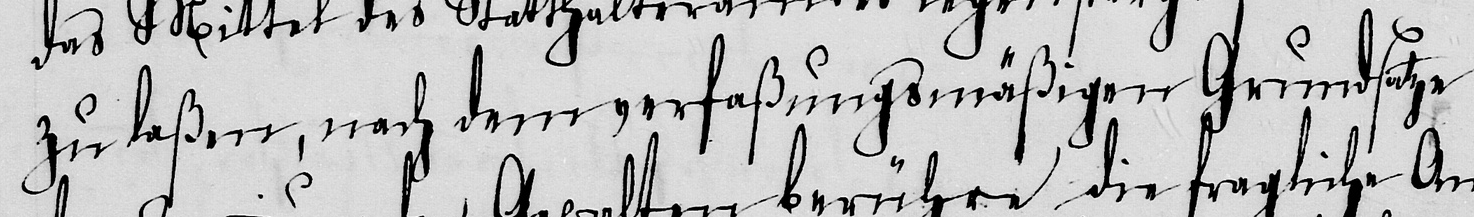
zu laßen, nach dem verfaßungsmäßigen Grundsatze
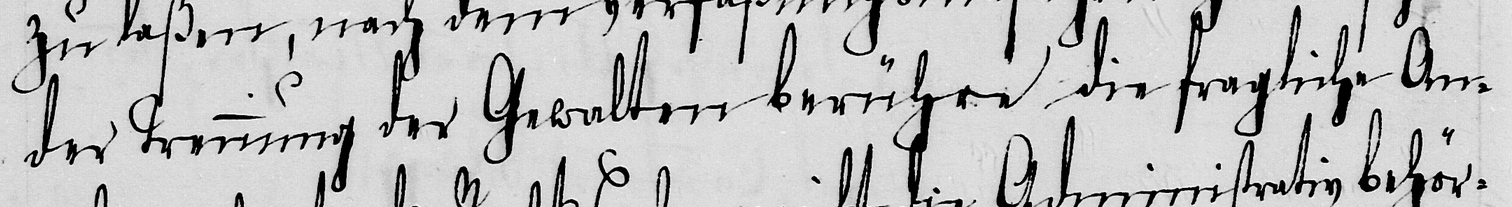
der Trennung der Gewalten berühre die fragliche An¬
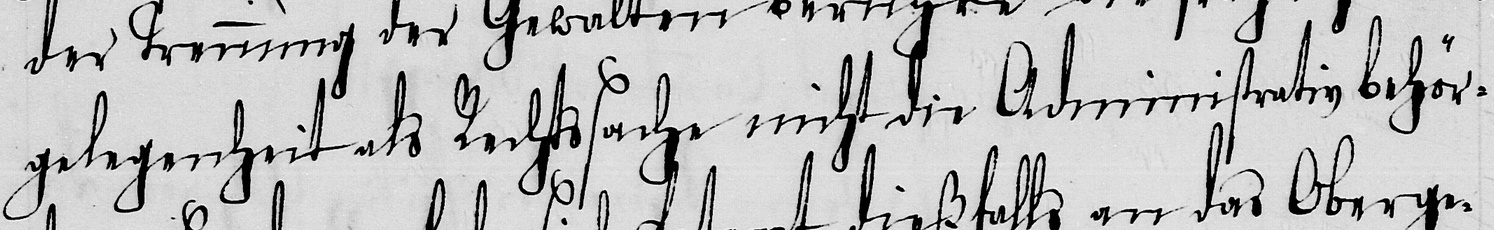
gelegenheit als Rechtssache nicht die Administrativbehör¬
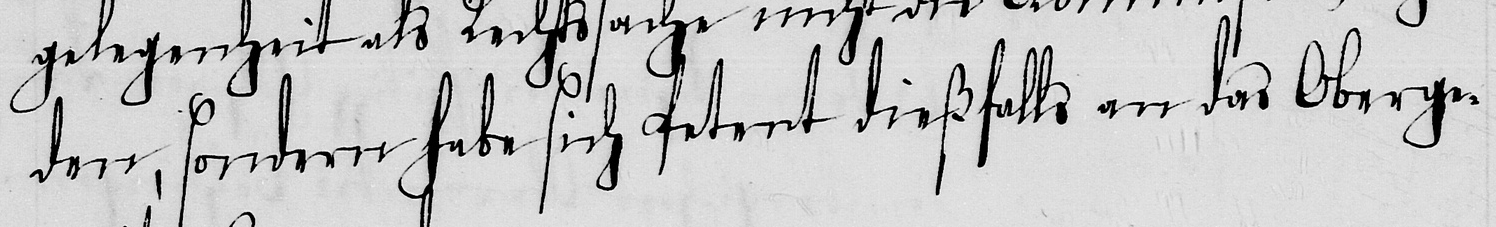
den, sondern habe sich Petent dießfalls an das Oberge¬
